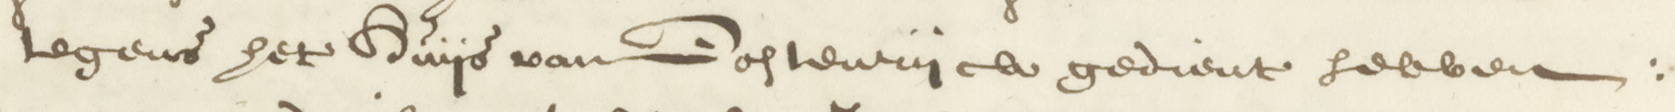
tegens het Huijs van Oostenrijck gedient hebben:
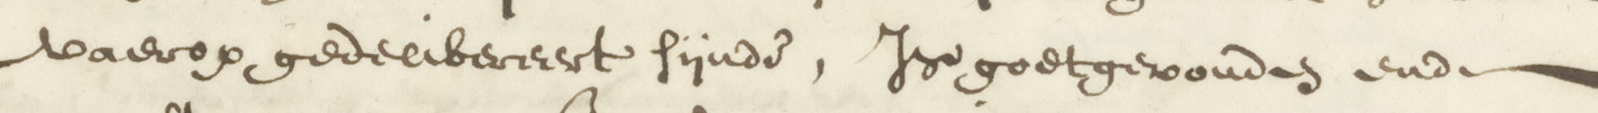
waerop gedelibereert sijnde, Is goetgevonden ende
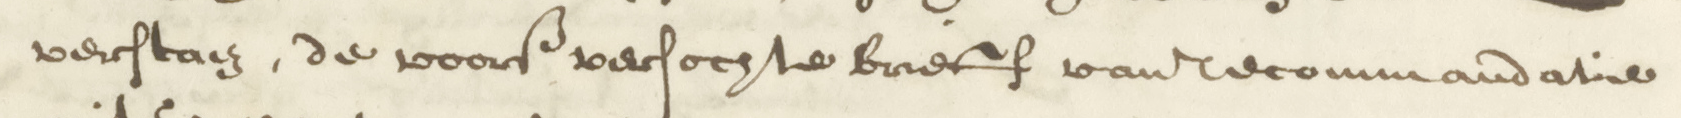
verstaen, de voors versochte brieff van recommandatie
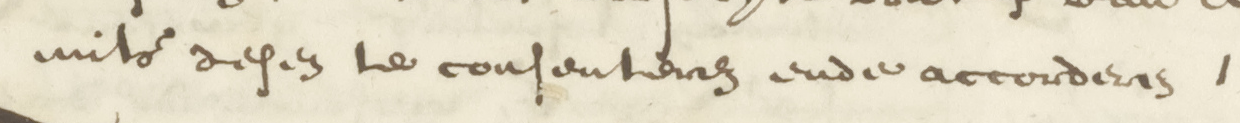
mits desen te consenteren ende accorderen.
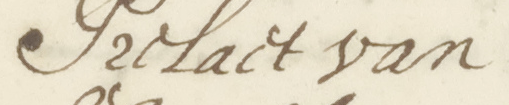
Prelaet van
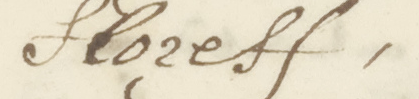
floreff.
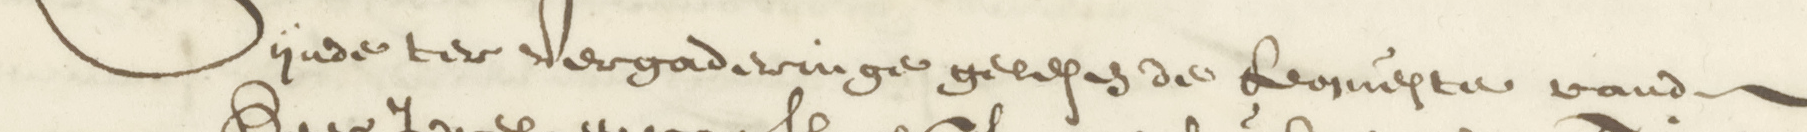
Sijnde ter vergaderinge gelesen de Requeste vande
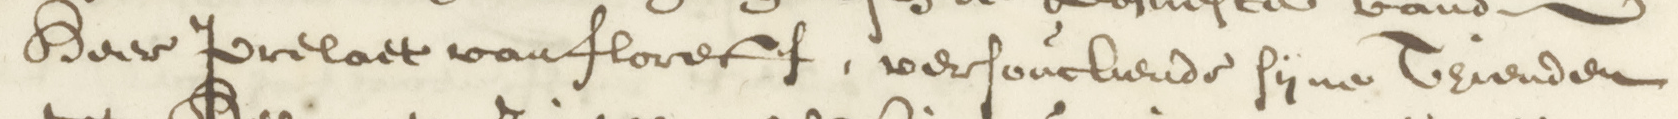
Heer Prelaet van Floreff, versouckende sijne Thienden
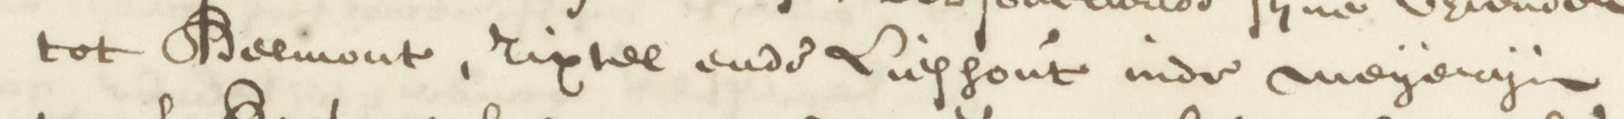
tot Helmont, rixtel ende Lieshout inde meijerije
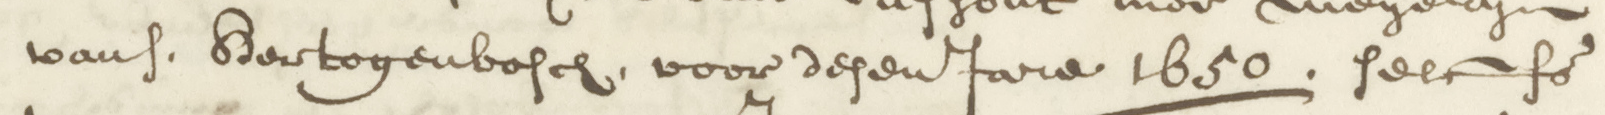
van s. Hertogenbosch, voor desen jare 1650. selffe
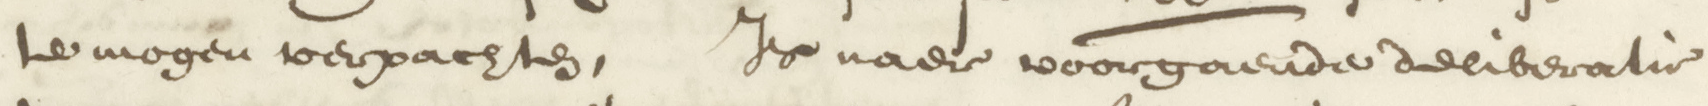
te mogen verpachten. Is naer voorgaende deliberatie
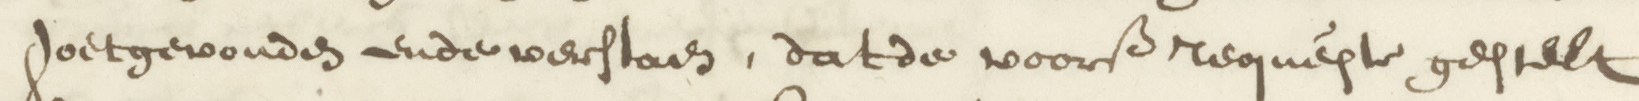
goetgevonden ende verstaen, dat de voors requeste gestelt
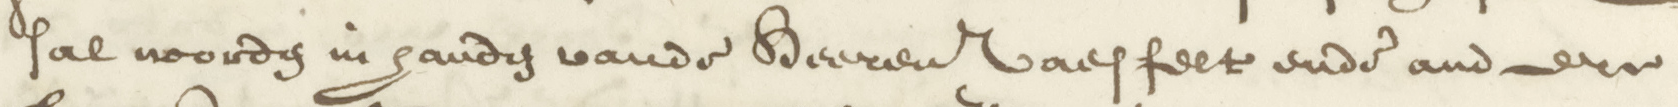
sal worden in handen vande Heeren Raesfelt ende andere
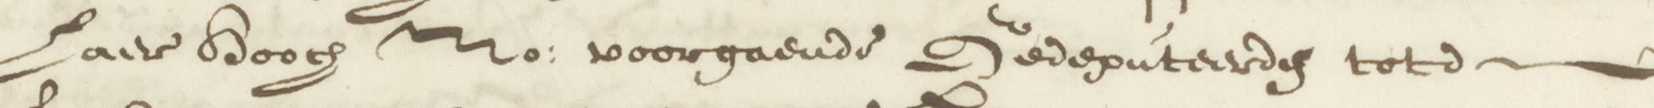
Haer Hooch Mo: voorgaende Gedeputeerden tot de
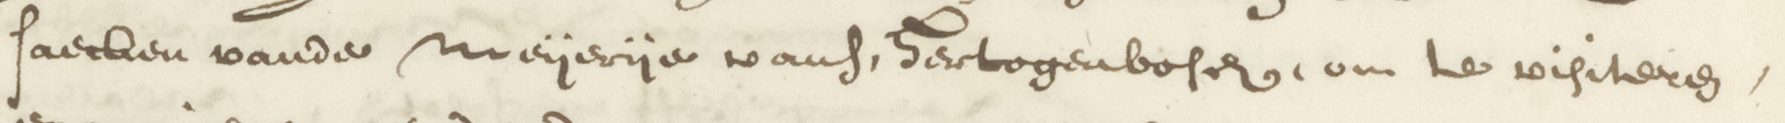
saecken vande Meijerije van s' Hertogenbosch, om te visiteren,
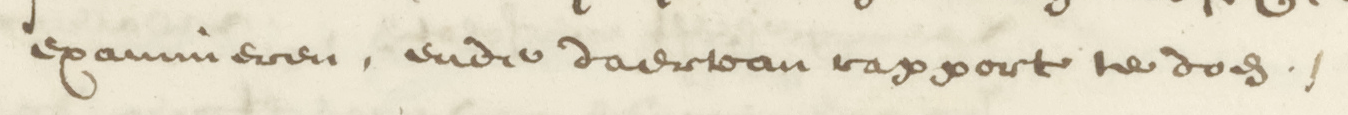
examineren, ende daervan rapport te doen.
